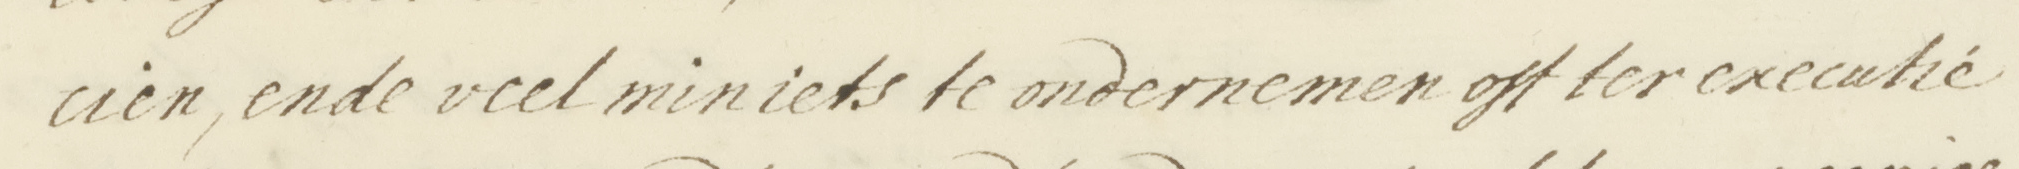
cien, ende veel miniets te ondermemen off ter executie
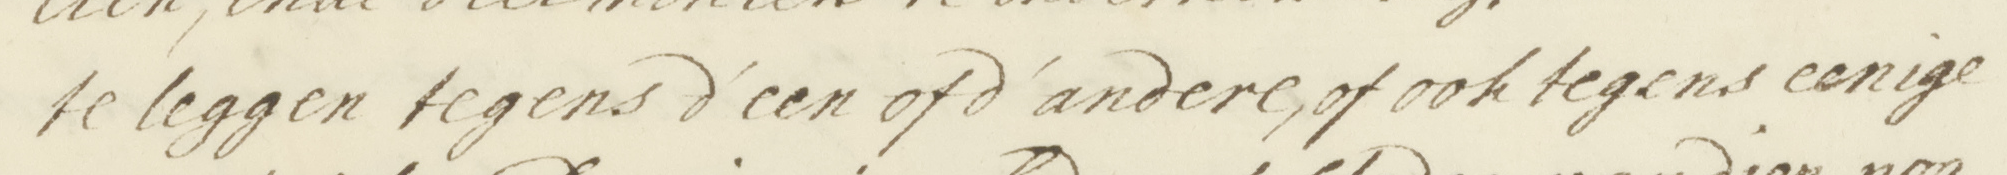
te leggen tegens d'een ofd'andere, of ook tegens eenige
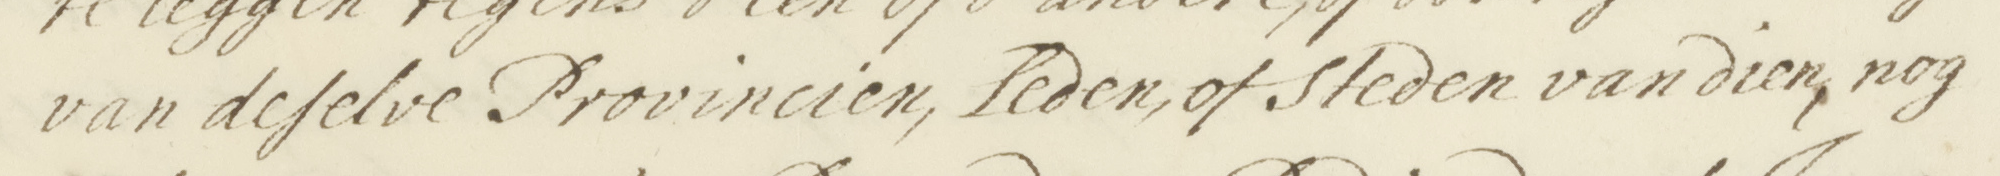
van deselve Provincien, leden, of steden van dien, nog
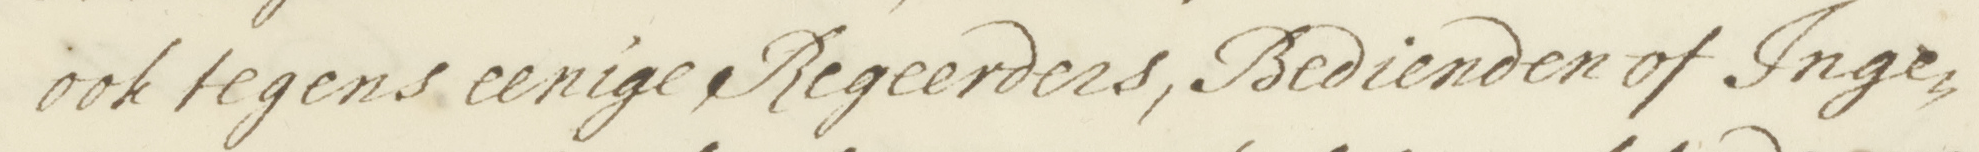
ook tegens eenige Regeerders, Bedienden of inge,,
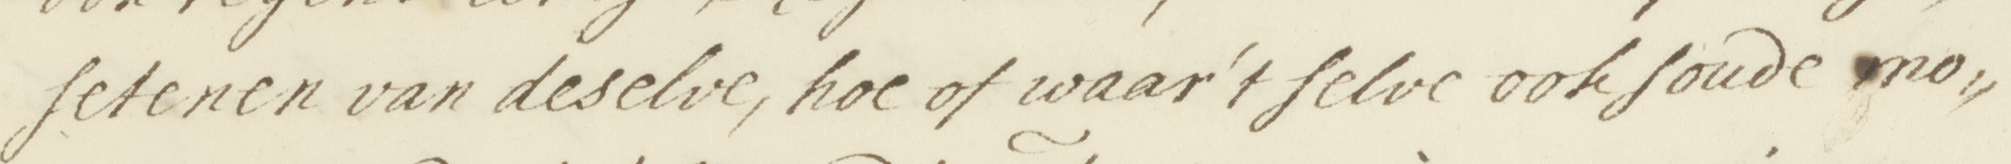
setenen van deselve, hoe of waar 't selve ook soude mo,,
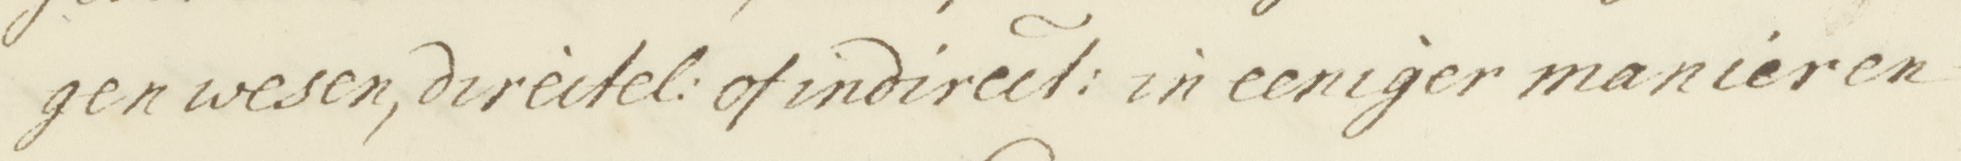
gen wesen directel: of indirect: in eeniger manieren
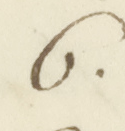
6.
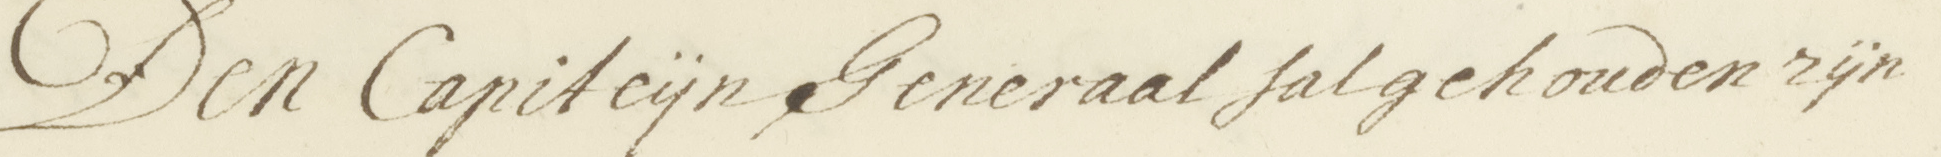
Den Capiteijn Generaal sal gehouden zijn
